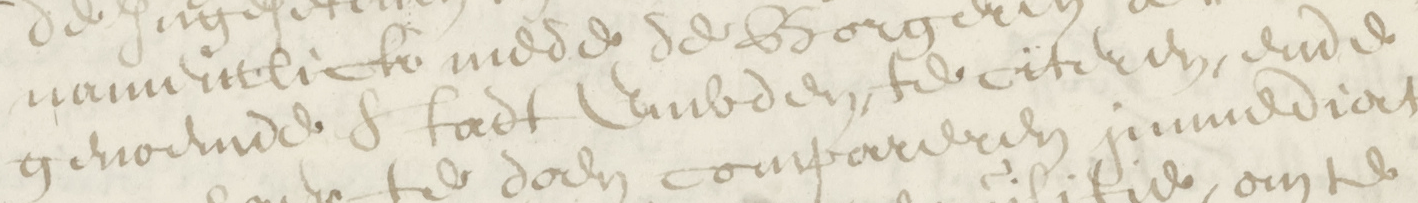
genoemde Stadt Embden, te citeren, ende
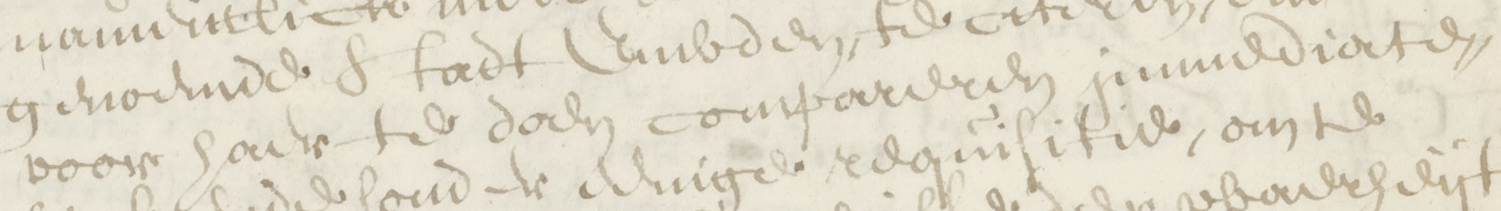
voor haer te doen compareren immediate„
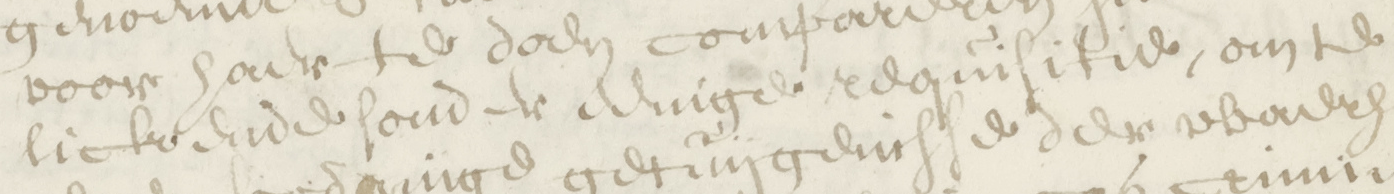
lick ende sonder eenige requisitie, om te
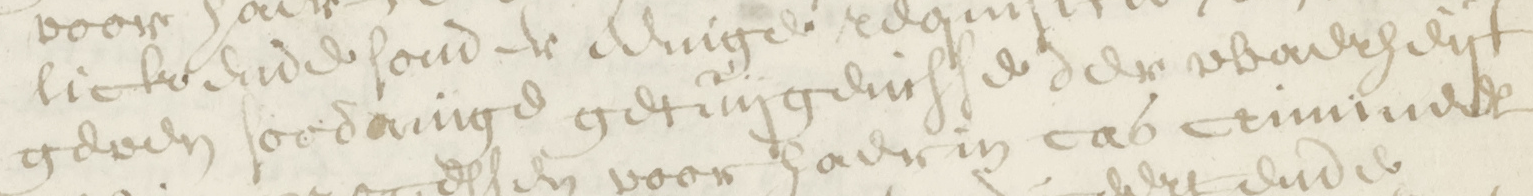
geven soodanige getuijgenisse der waerheijt
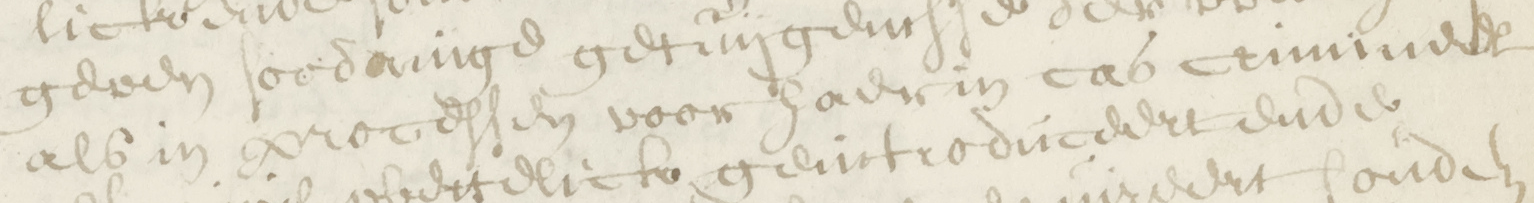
als in processen voor haer in cas crimineel
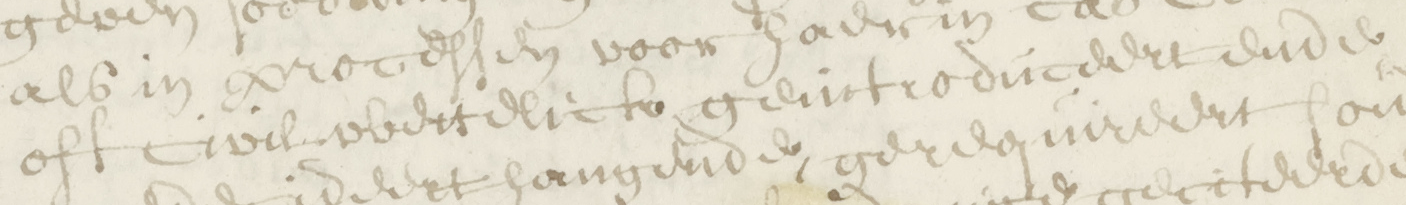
off civil wettelick geintroduceert ende
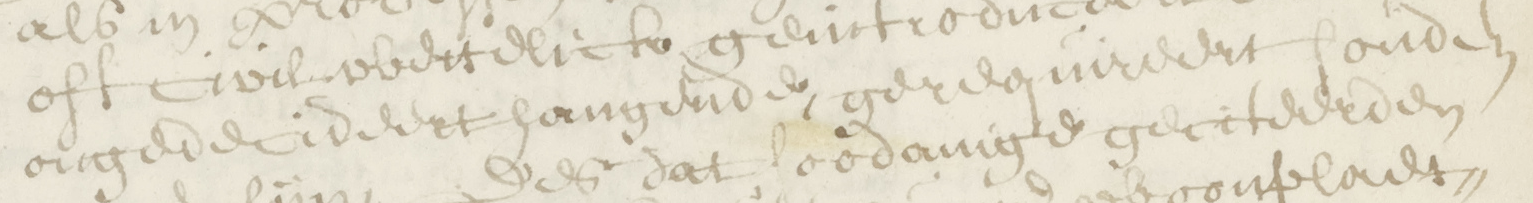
ongedecideert hangende, gerequireert souden
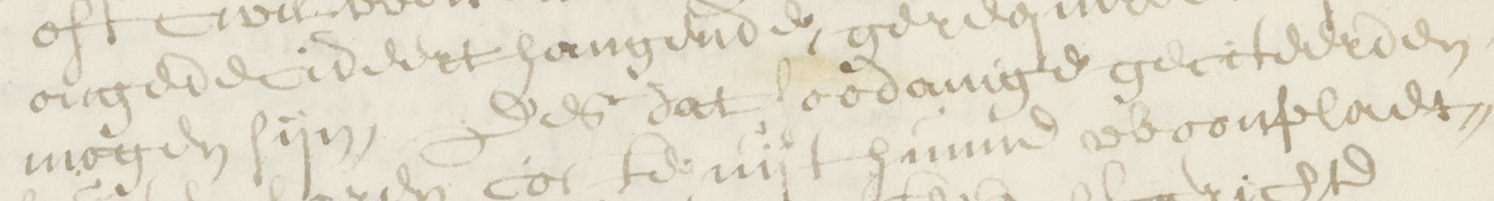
mogen sijn, Des dat soodanige geciteerden
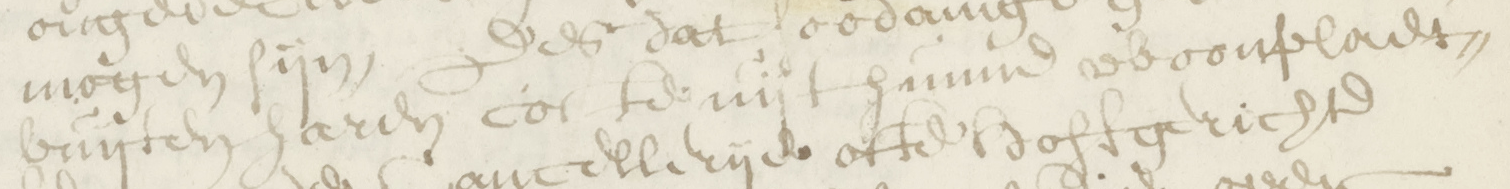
buijten haren costen uijt hunne woonplaet„
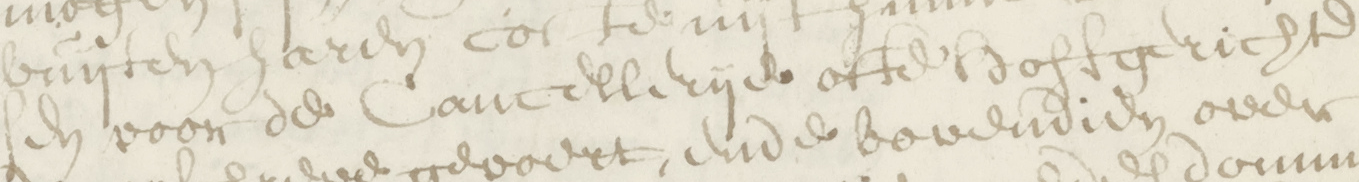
sen voor de Cancellerije ofte Hoffgerichte
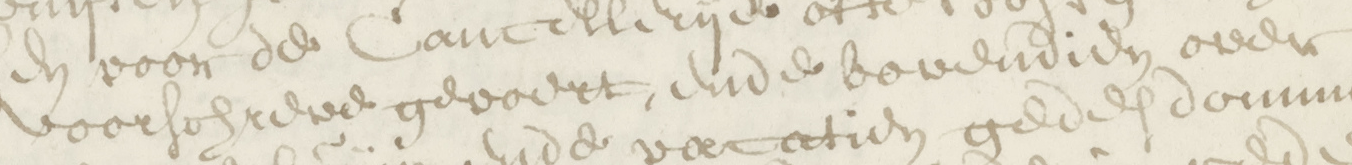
voorschreve gevoert, ende bovendien over
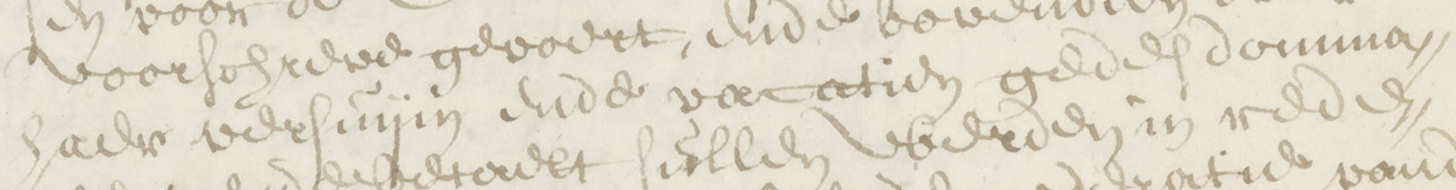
haer versuijm ende vacatien gedesdomma„
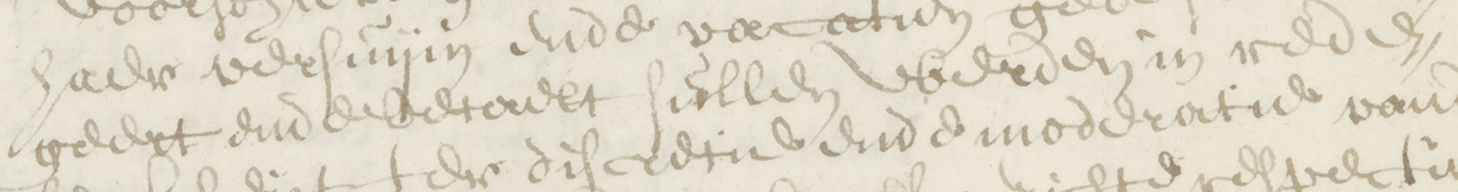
geert ende betaelt sullen werden in rede„
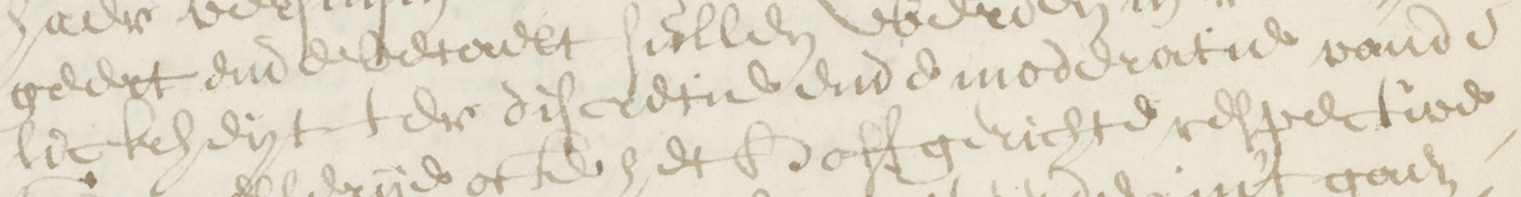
lickheijt ter discretie ende moderatie vande
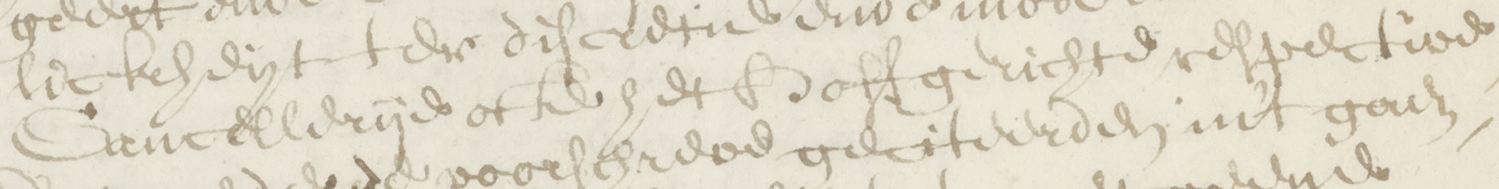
Cancellerije ofte het Hoffgerichte respective.
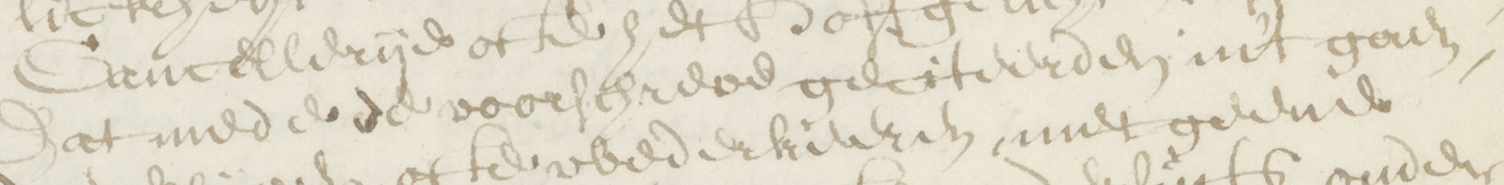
Dat mede de voorschreve geciteerden in't gaen,
